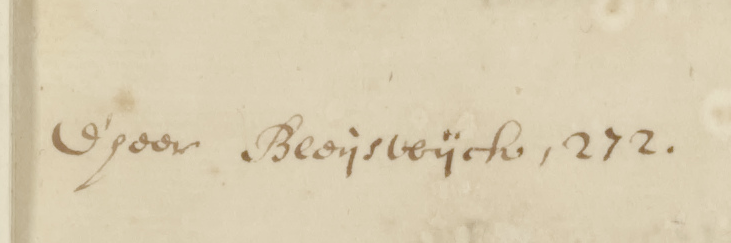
D'heer Bleijswijck, 272.
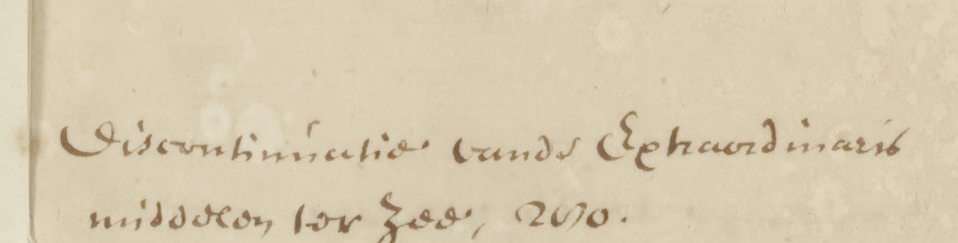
Discontinuatie vande Extraordinaris
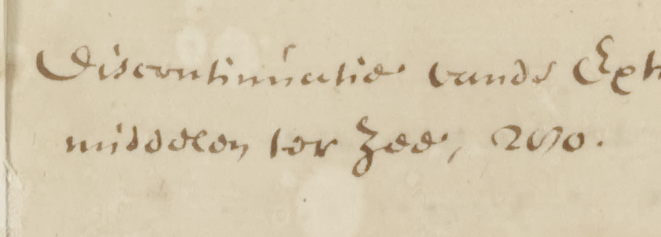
middelen ter zee, 280.
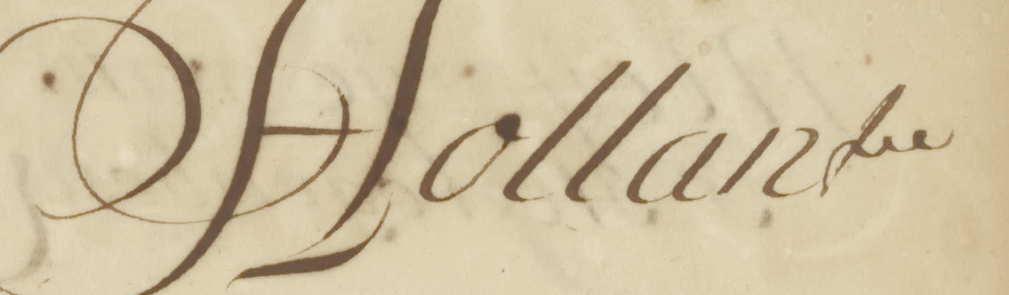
Hollant
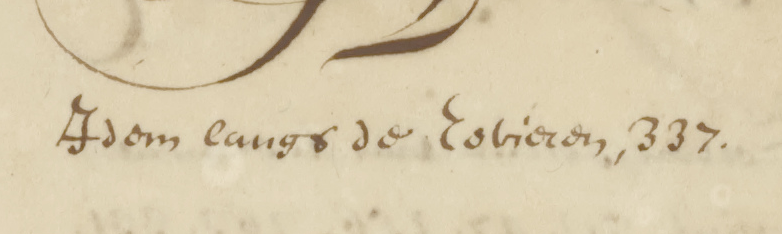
Idem langs de revieren, 337
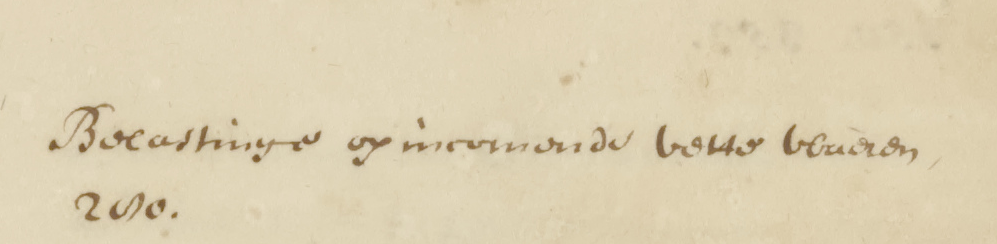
Belastinge op incomende vette waeren,
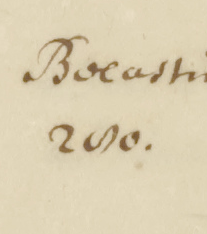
280.
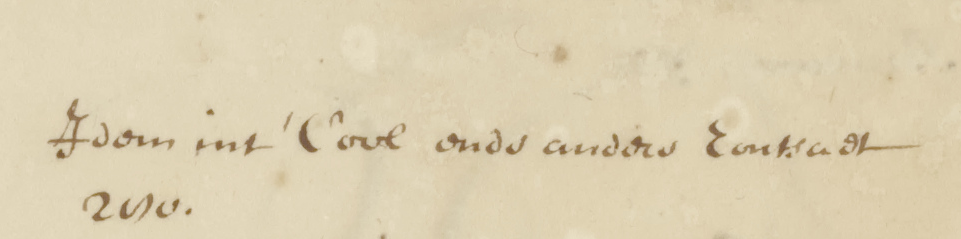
Idem int 'Cool ende andere rontsaet
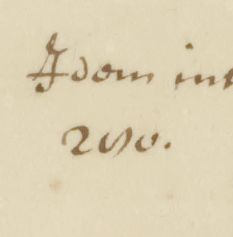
280.
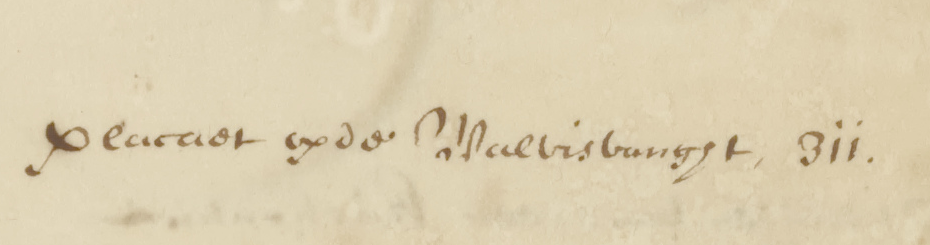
placaet op de Walvisvangst, 311.
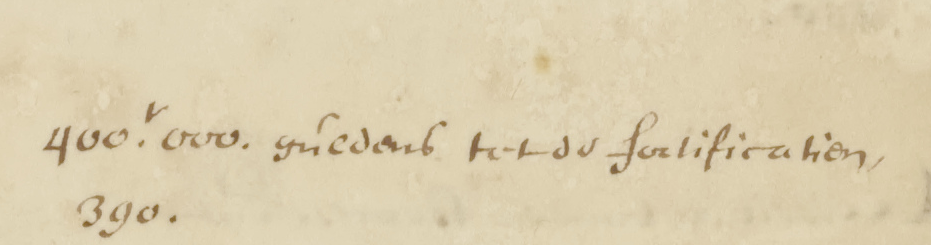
400.000 guldens tot de fortificatien,
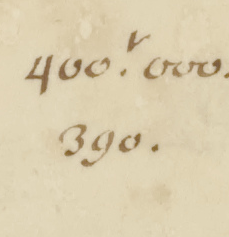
390.
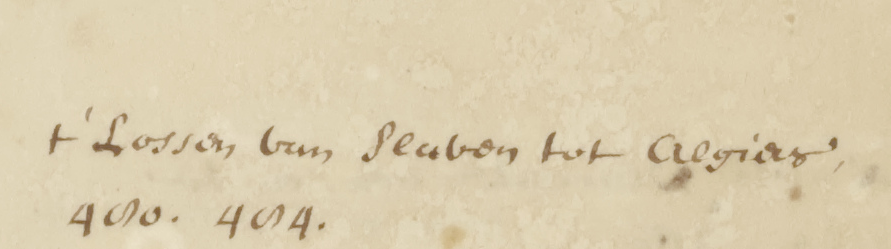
t' Lossen van slaven tot Algiers,
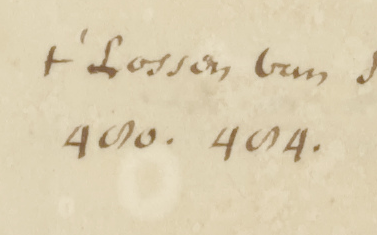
480, 484.
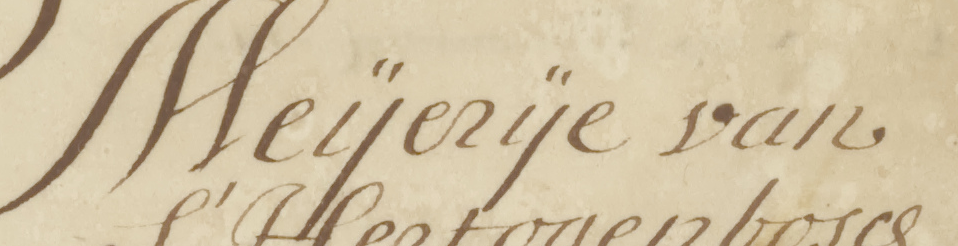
Meijerije van
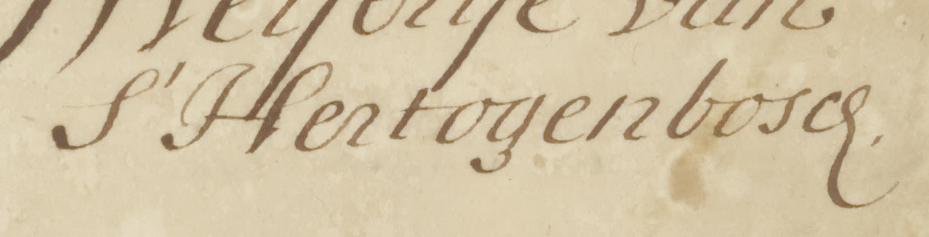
s'Hertogenbosch.
